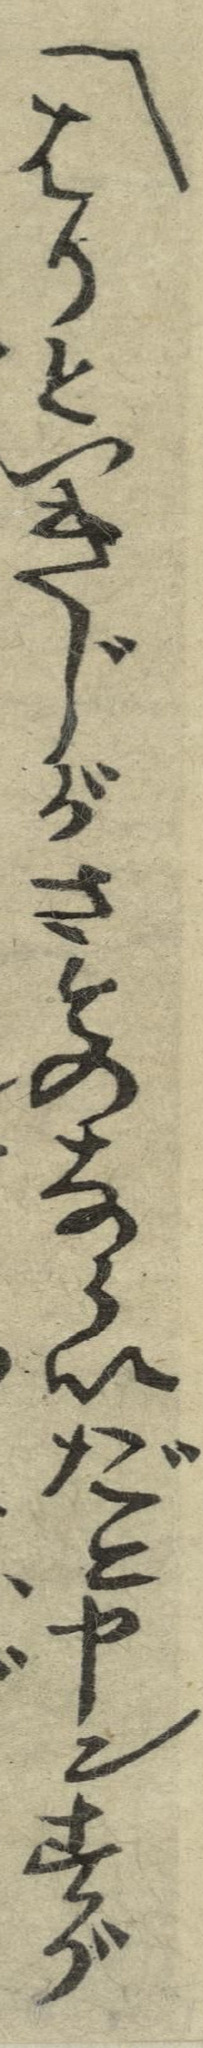〽はりといきじがさとのならいだと申ンすが
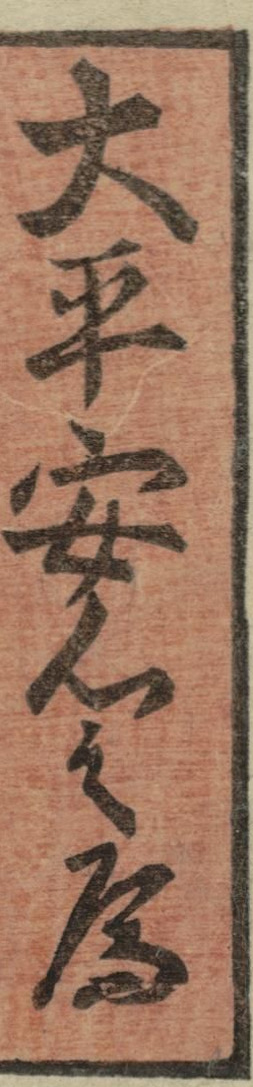大平安心之為
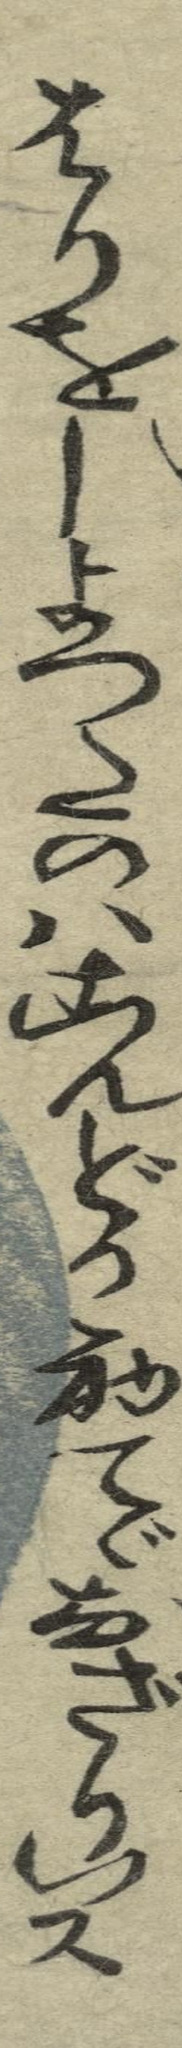はりをしよつたのはこんどか初てゞおざりいス
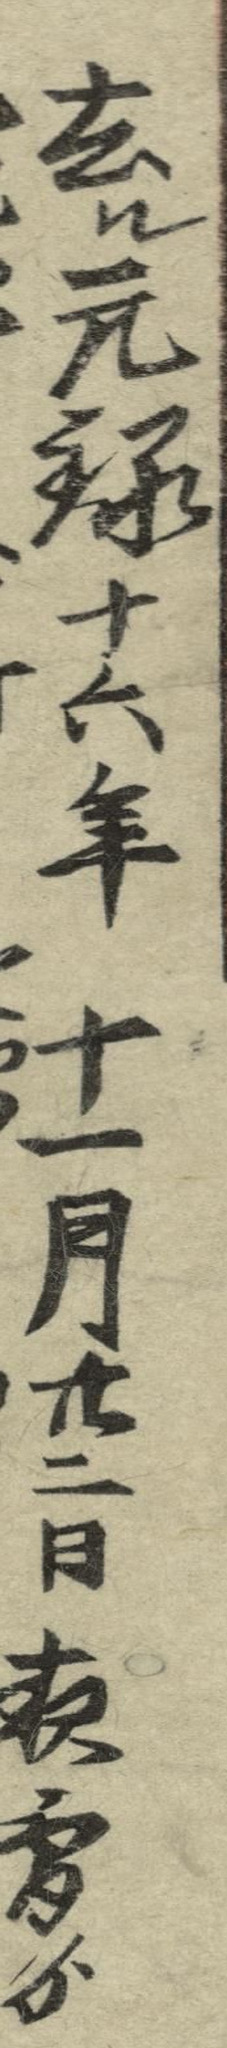去ル元禄十六年十一月廿ニ日夜宵ゟ
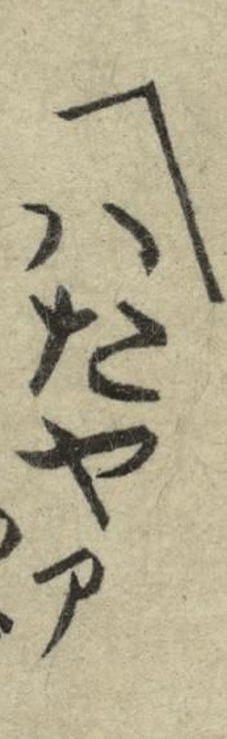〽はたヤア
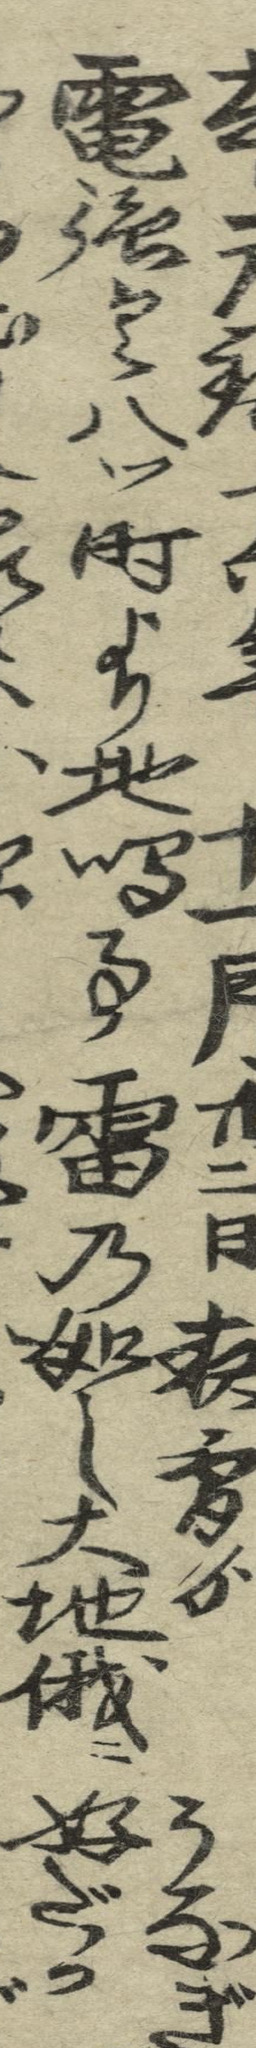雷強く八ツ時より地鳴事雷の如し大地俄ニ
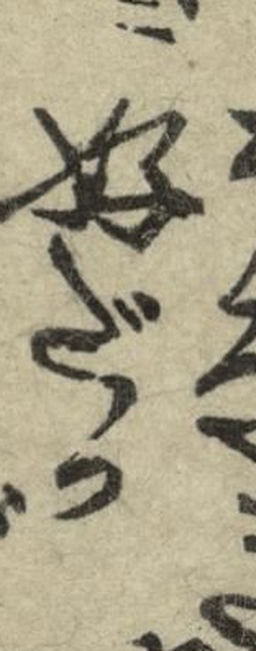好だか
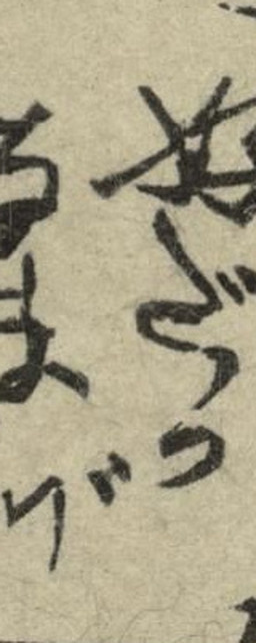なまづ
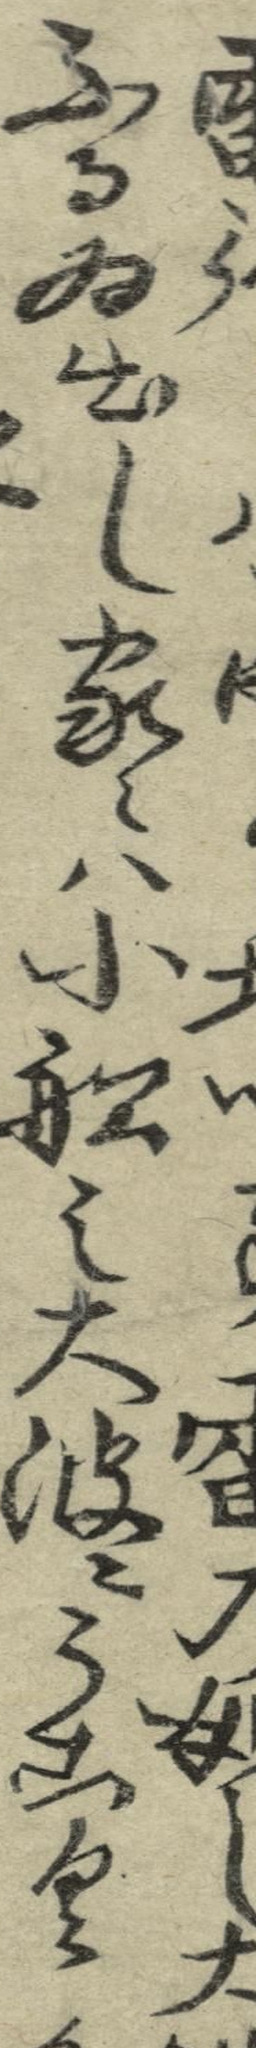ふるゐ出し家々は小船之大波ニうこくか
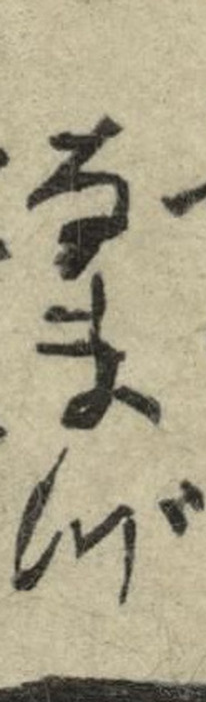なまづ
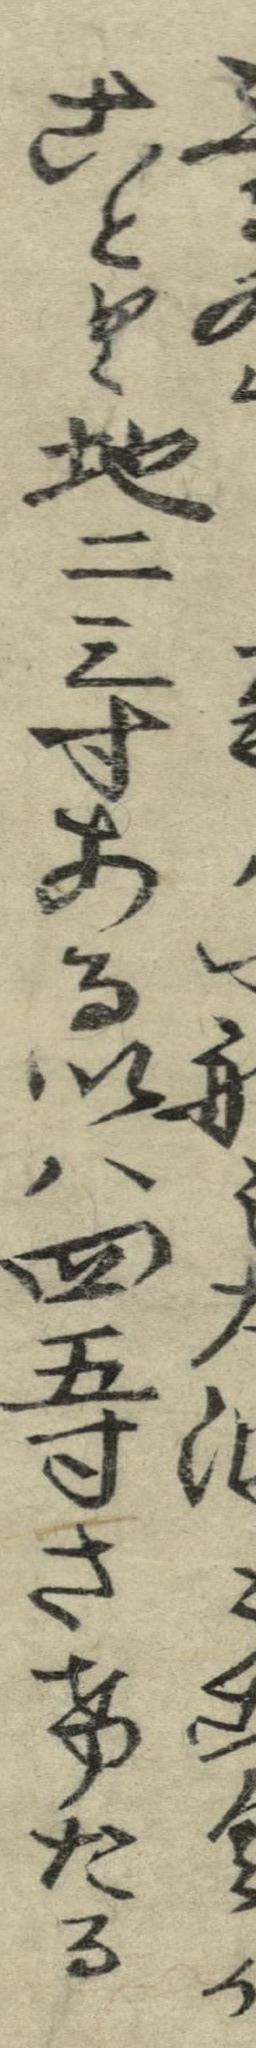ことく地二三寸あるいは四五寸さけたる
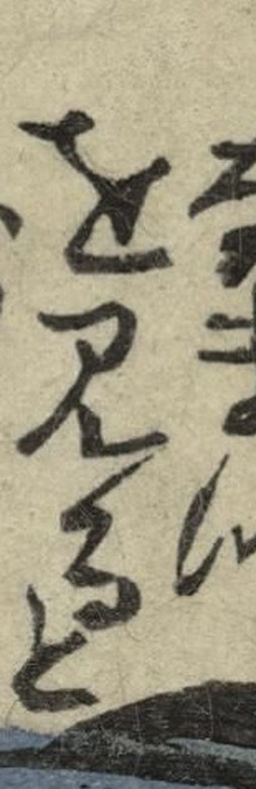を見ると
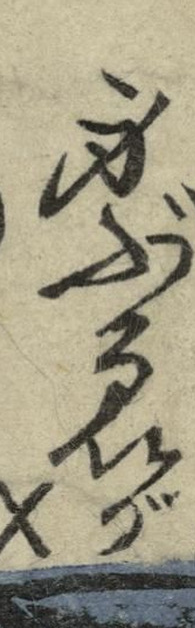身ぶるいが
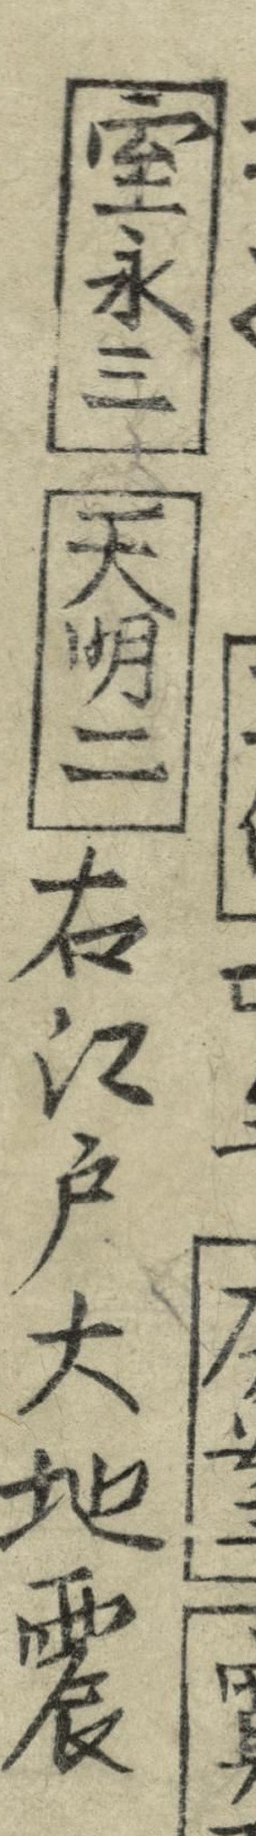宝永三天明二右江戸大地震
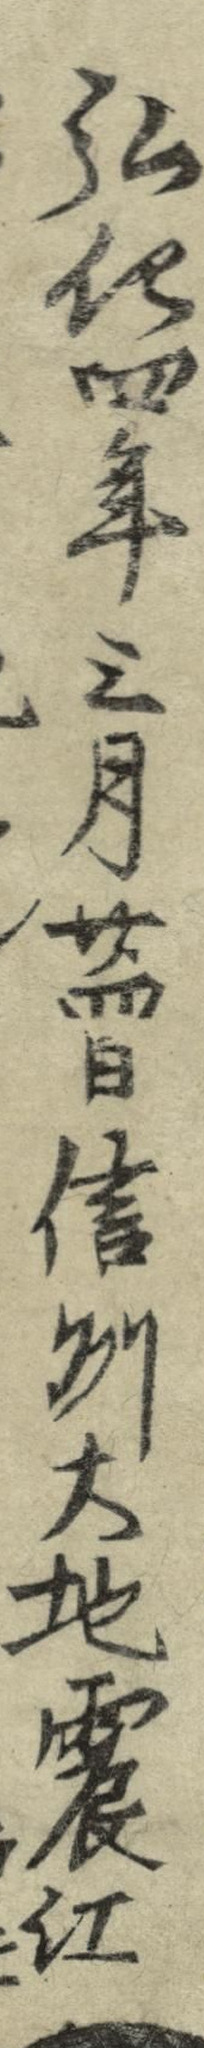弘化四年三月廿四日信州大地震江戸モ
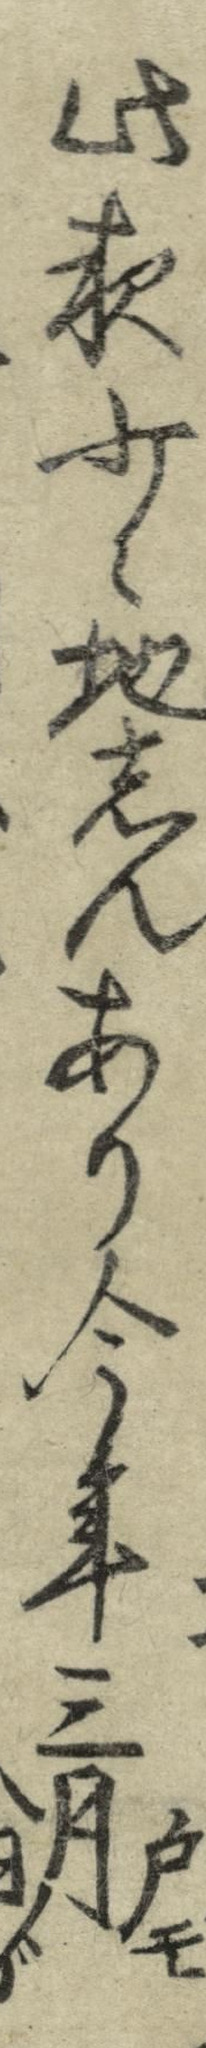此夜少々地しんあり今年三月八日ゟ
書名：太平安心之為
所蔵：東京大学地震研究所図書室 Earthquake Research Institute Library, The University of Tokyo, JAPAN
